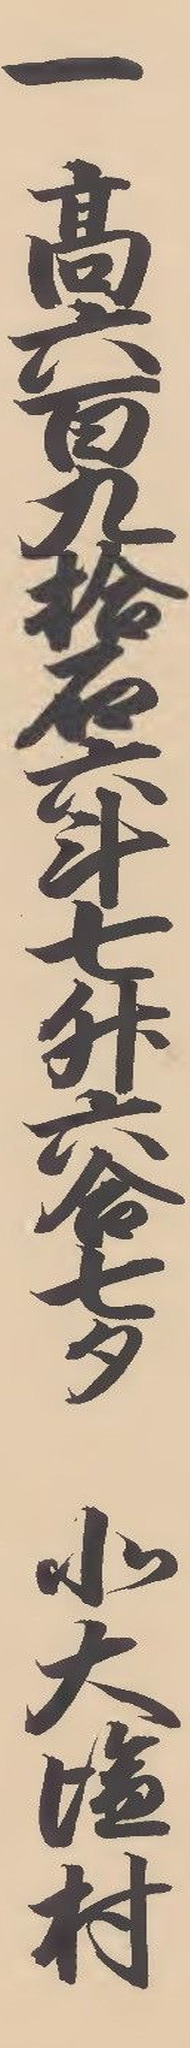一高六百九拾石六斗七升六合七勺北大塩村
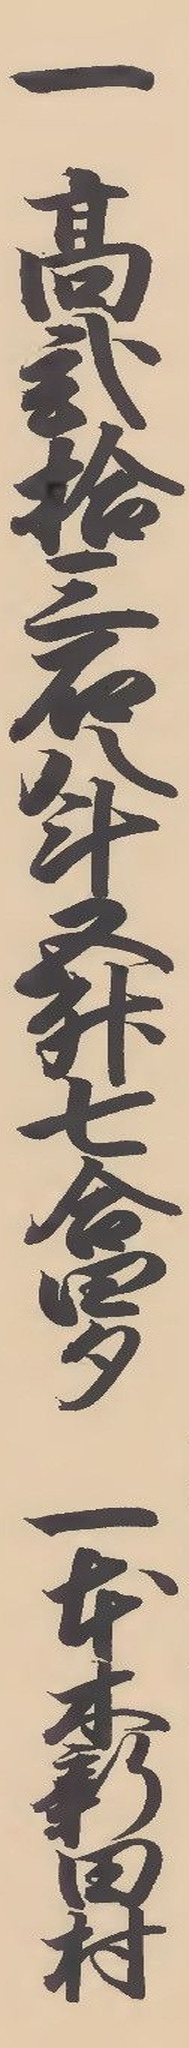一高弐拾三石八斗五升七合四勺一本木新田村
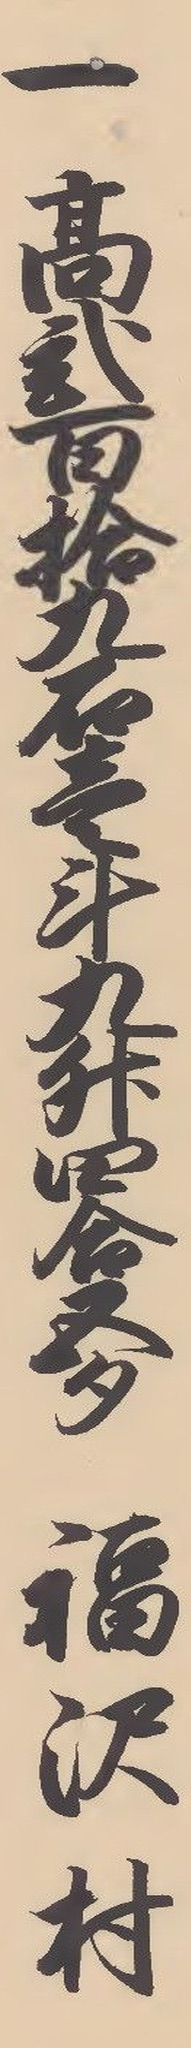一高弐百拾九石壱斗九升四合五勺福沢村
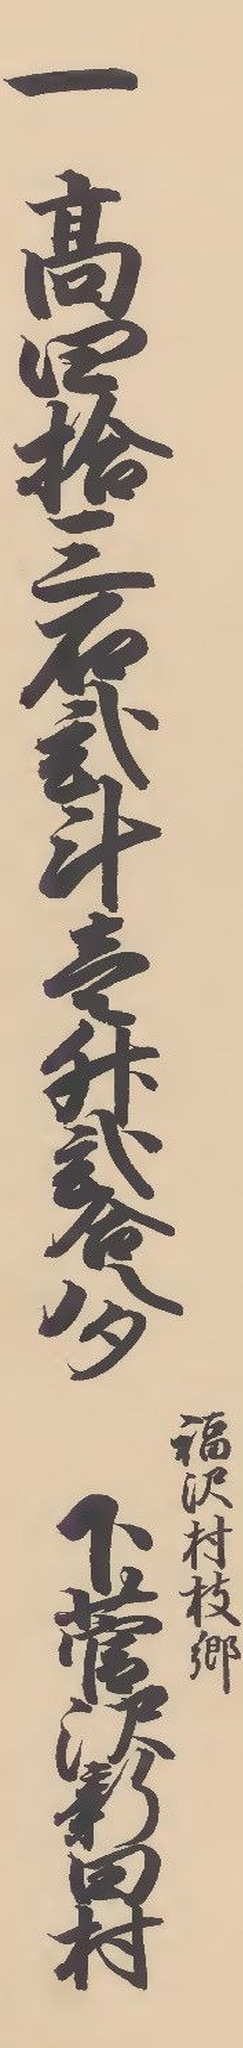一高四拾三石弐斗壱升弐合八勺下菅沢新田村

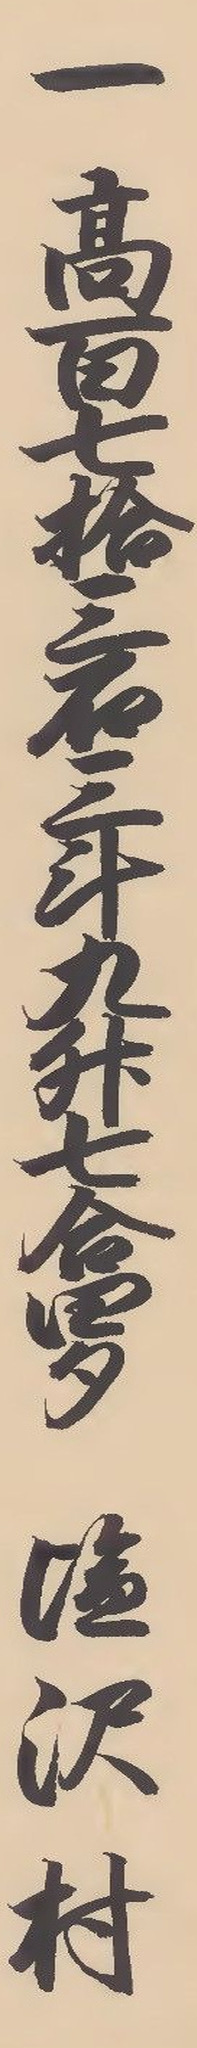一高百七拾三石三斗九升七合四勺塩沢村
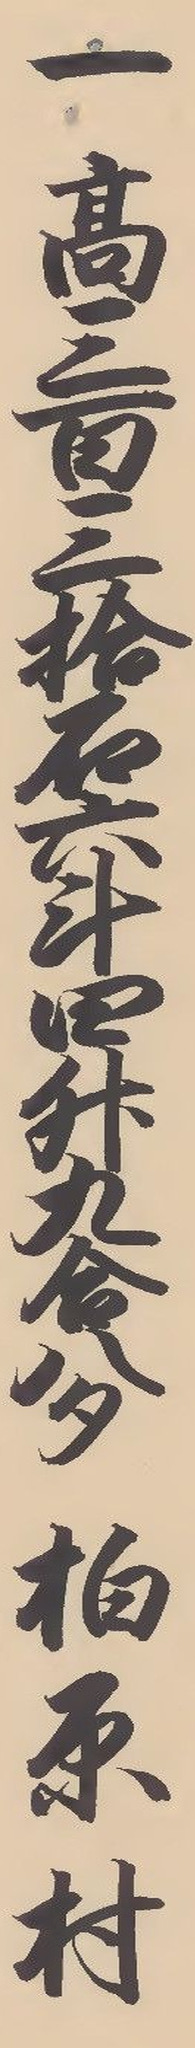一高三百三拾石六斗四升九合八勺柏原村
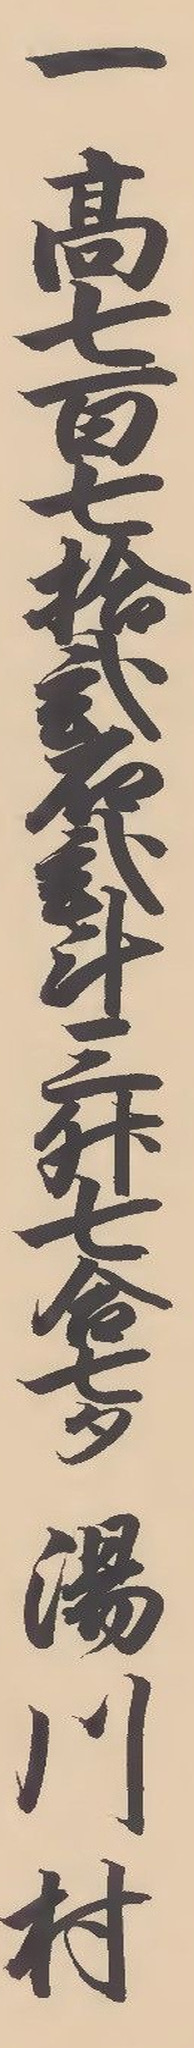一高七百七拾弐石弐斗三升七合七勺湯川村
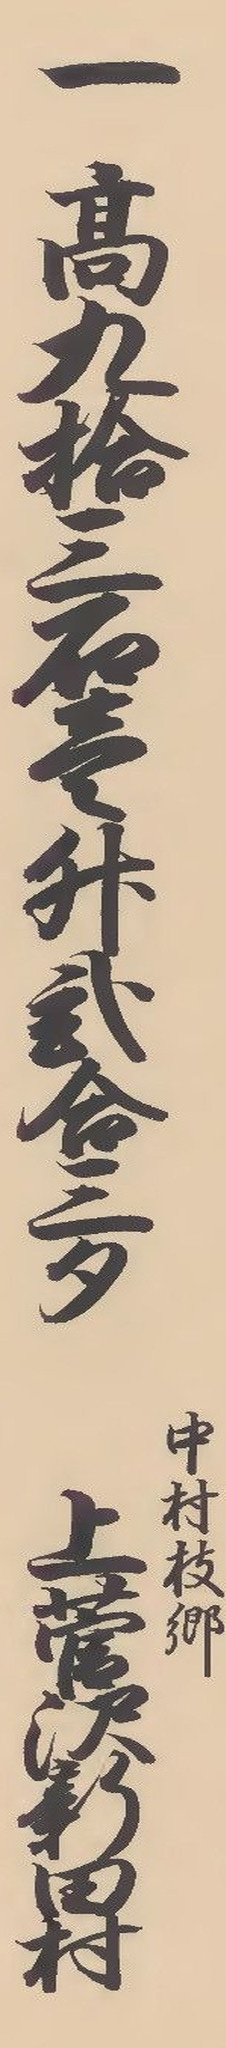一高九拾三石壱升弐合三勺上菅沢新田村
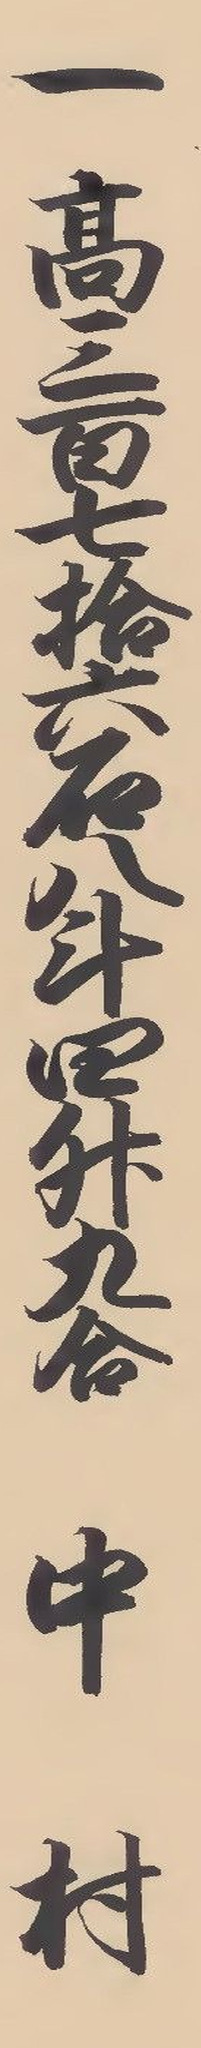一高三百七拾六石八斗四升九合中村
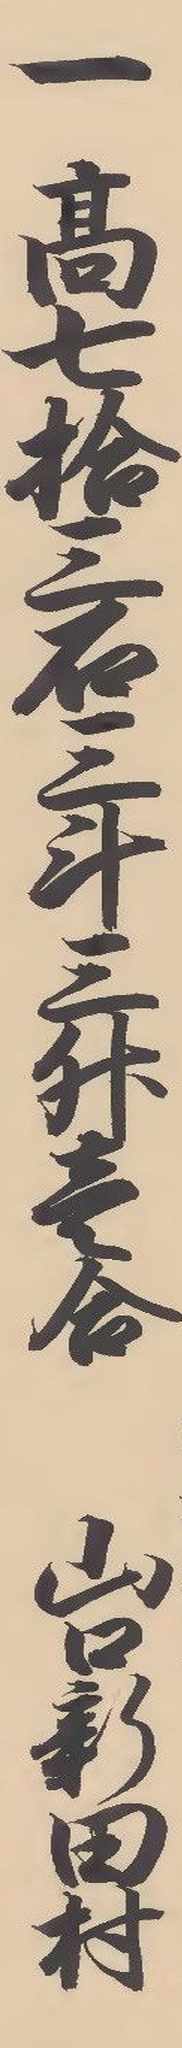一高七拾三石三斗三升壱合山口新田村
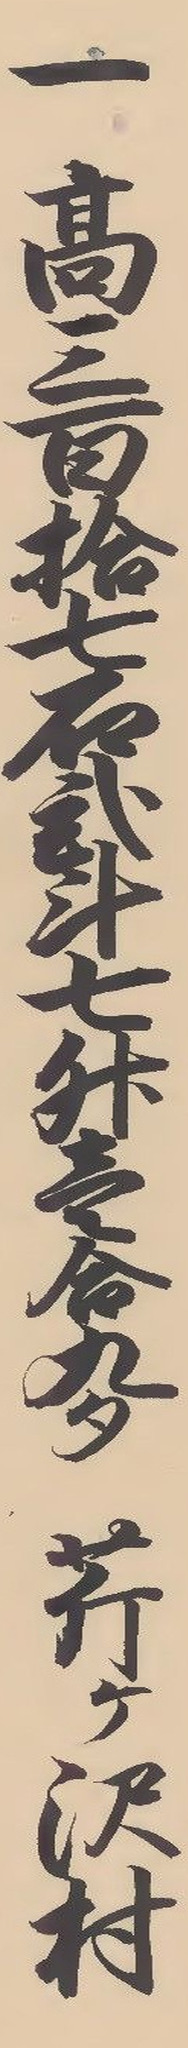一高三百拾七石弐斗七升壱合九勺芹ヶ沢村

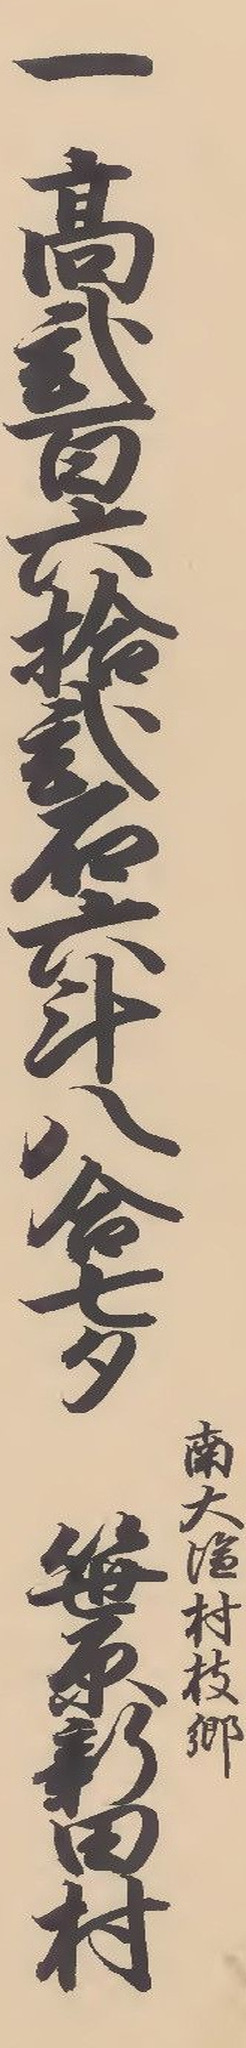一高弐百六拾弐石六斗八合七勺笹原新田村
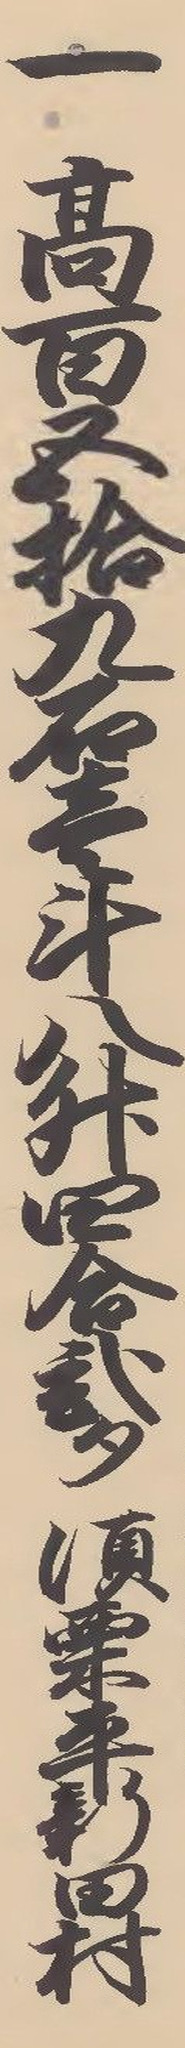一高百五拾九石壱斗八升四合弐勺須栗平新田村
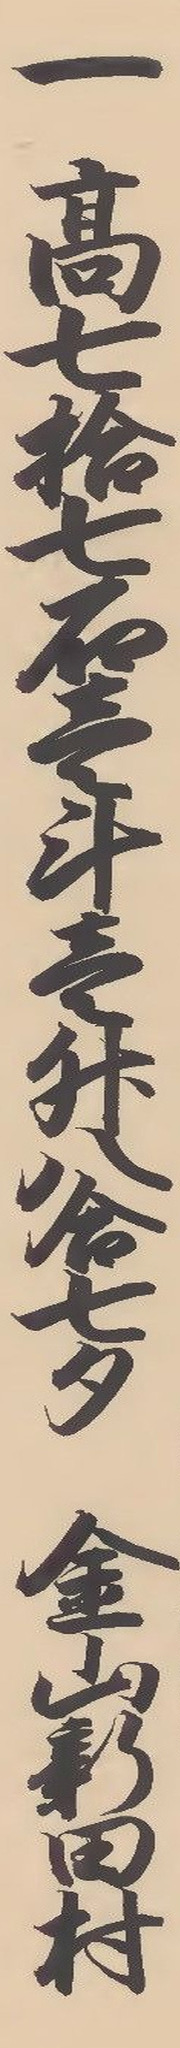一高七拾七石壱斗壱升八合七勺金山新田村
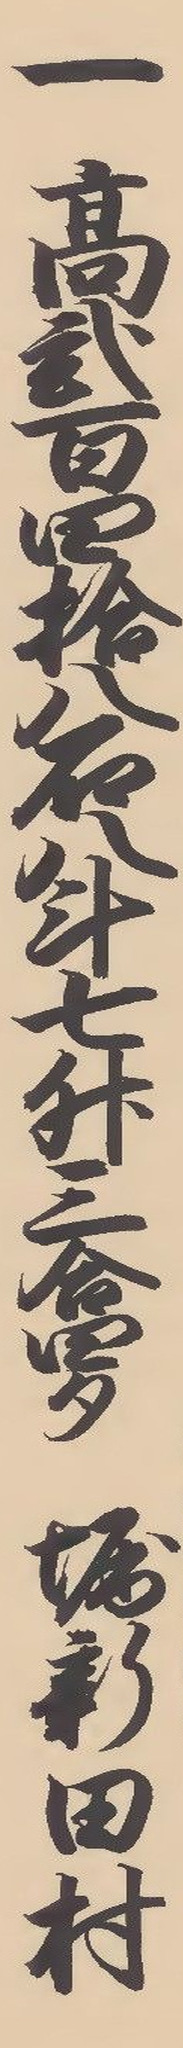一高弐百四拾八石八斗七升三合四勺堀新田村
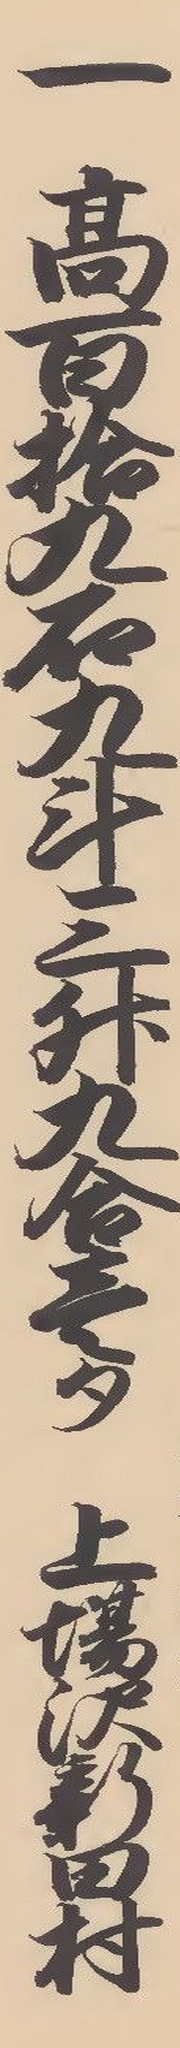一高百拾九石九斗三升九合壱勺上場沢新田村
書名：信濃国郷帳
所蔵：国立公文書館 National Archives of Japan
